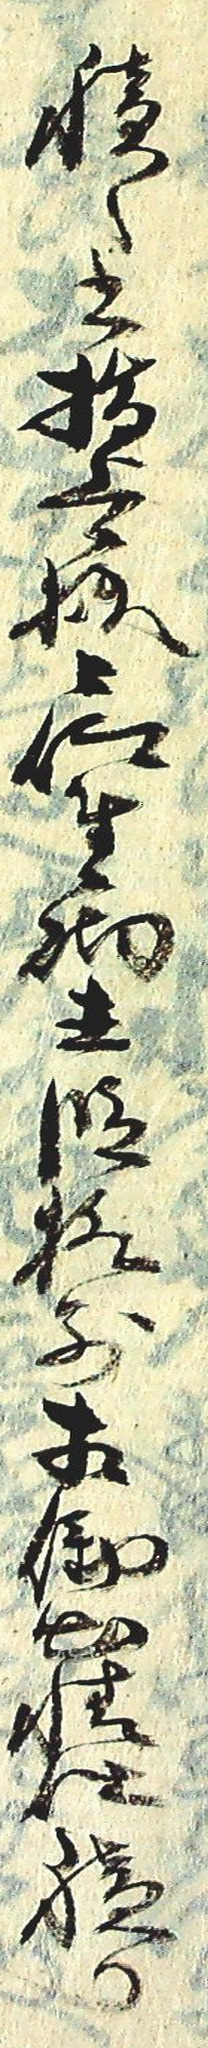積り書指上候様被仰付候砌直段格別相働出情仕積り
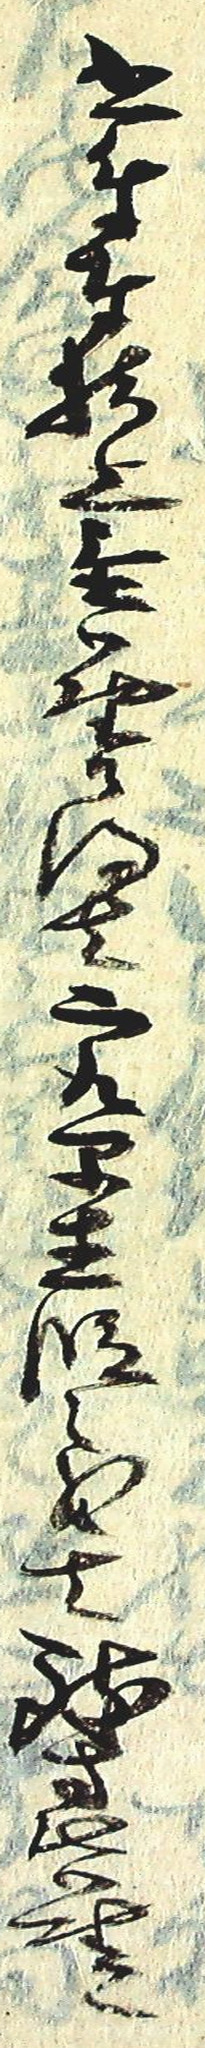書付奉指上置御座候得は最早直段之義は致方無御座候
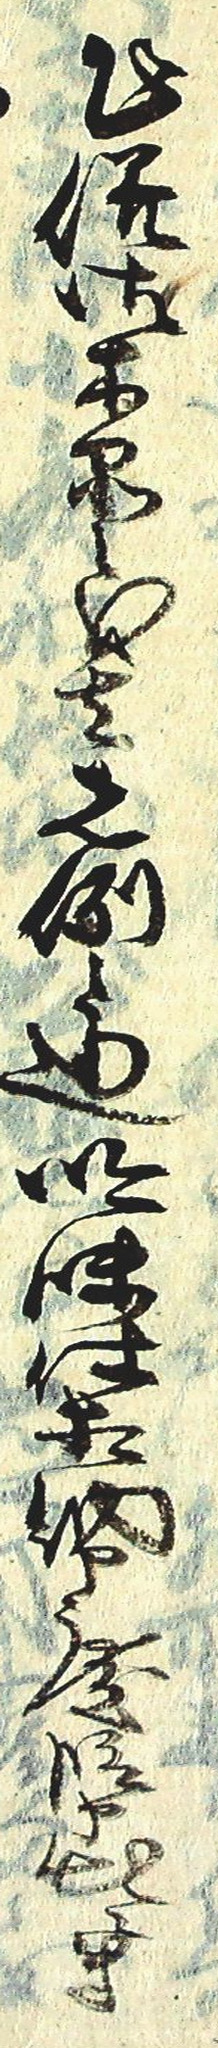乍併御木品之義は先例之通吟味仕相納申度段申出候に付
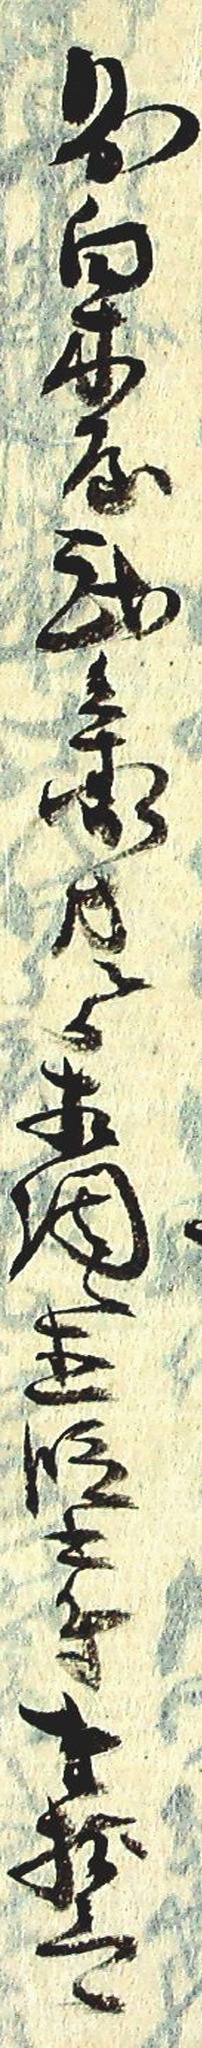則白木屋武兵衛方にて相調候直段書付奉指上候
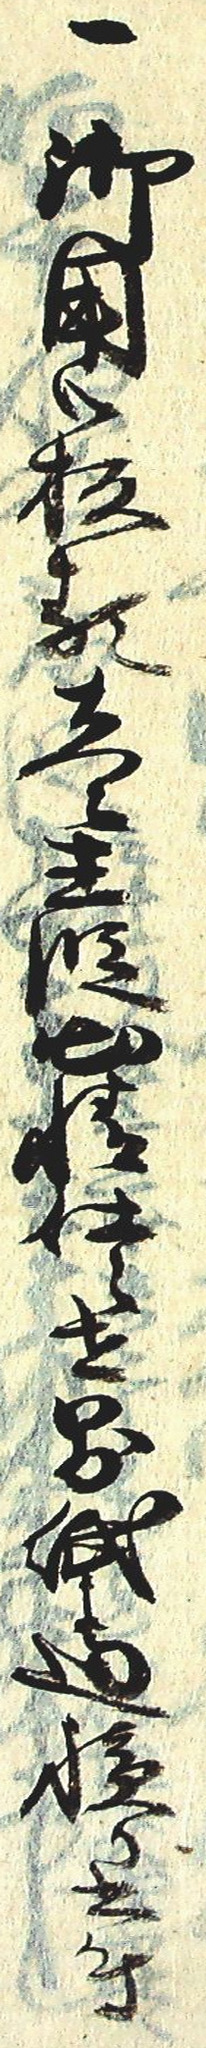一御用御板類克々直段出情仕らせ別紙之通積り書付
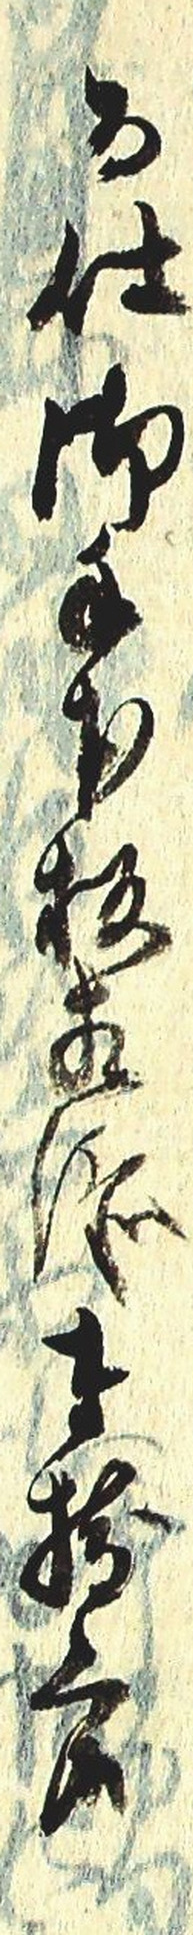為仕御手本板相添奉指上候
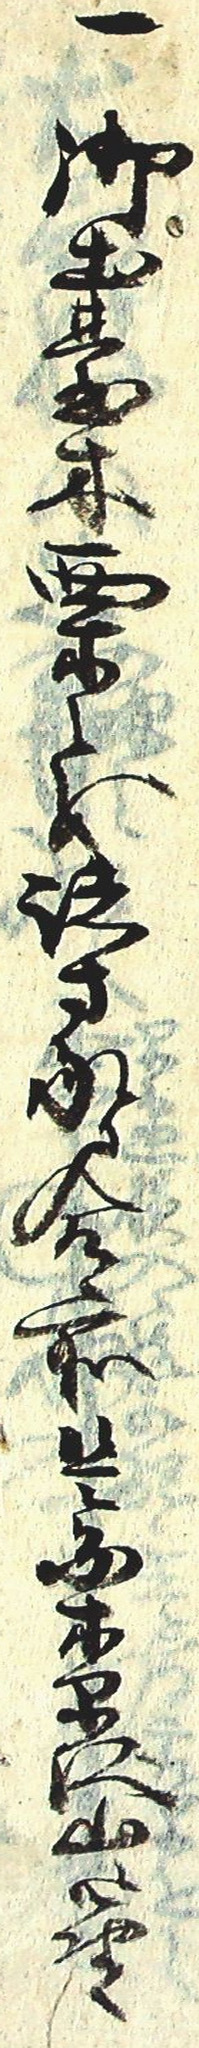一御土台木栗之義諸方承り合候所且亦木品沢山に御座候
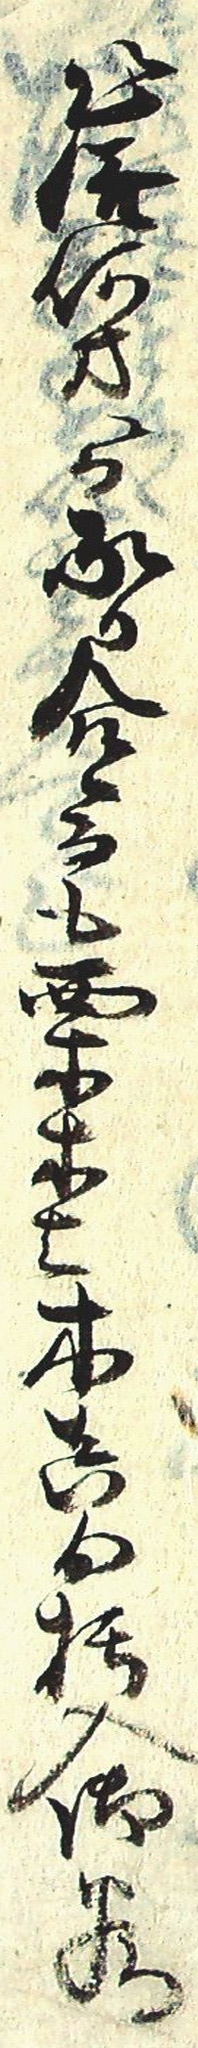乍併何方にて承り合候ても栗木は木真ゟ朽入御為

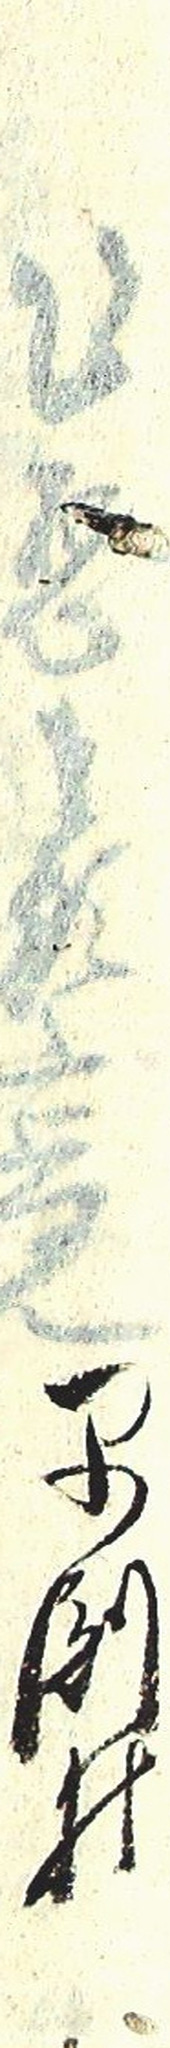早淵村
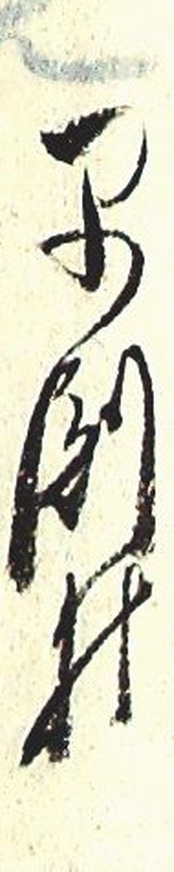早淵村
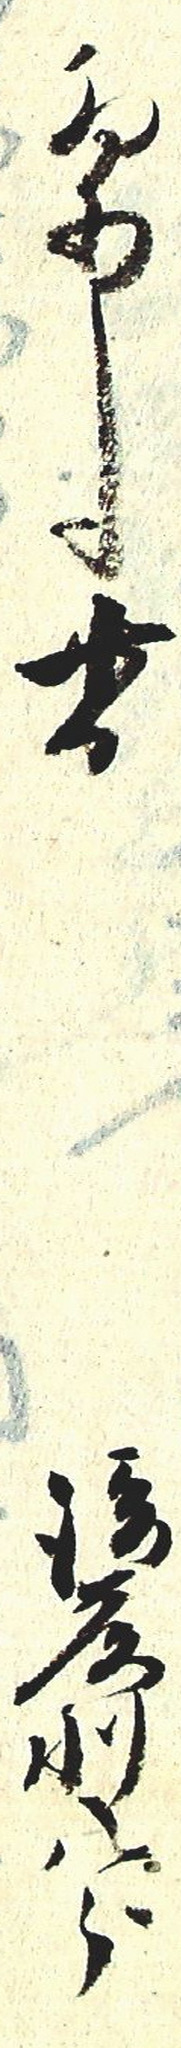卯五月十日後藤利八郎
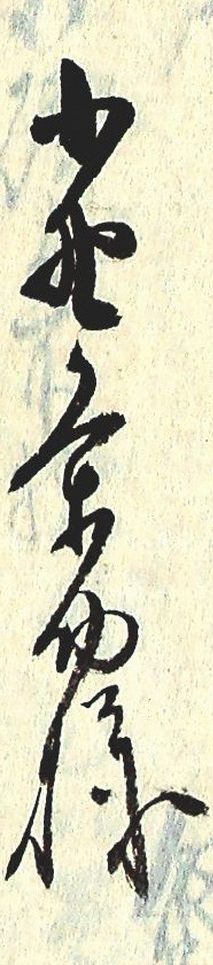小野久米助様
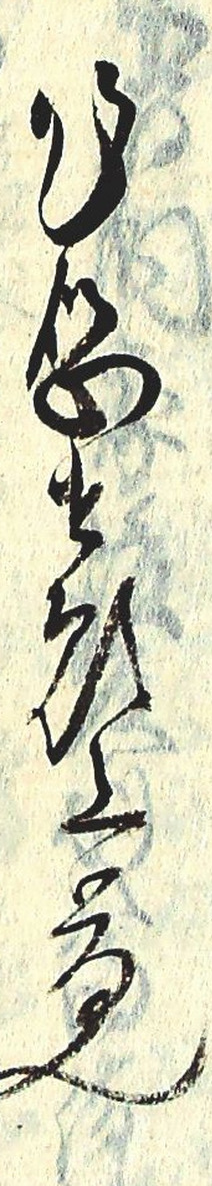乍恐奉願上覚
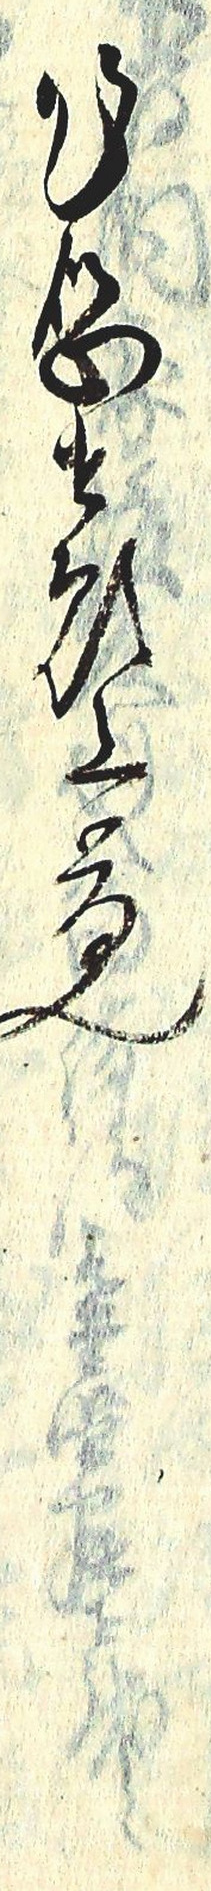乍恐奉願上覚
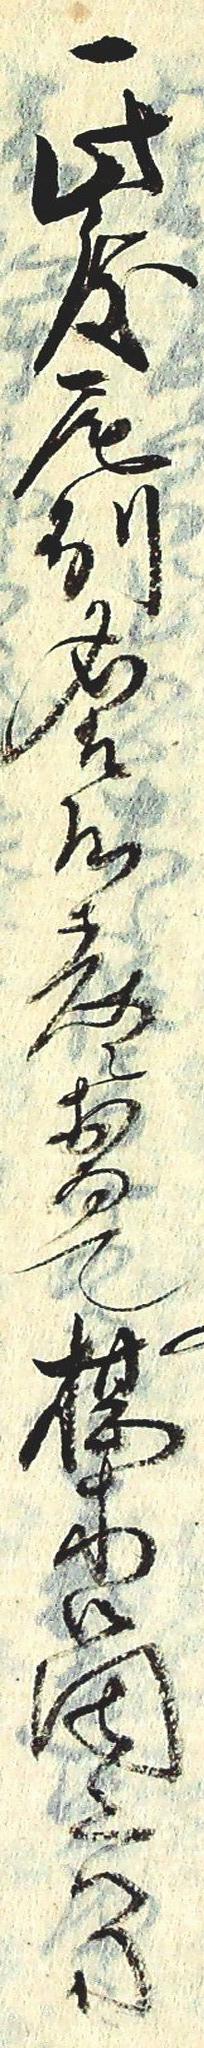一此度尾州名古屋表におゐて椹木御調上御用
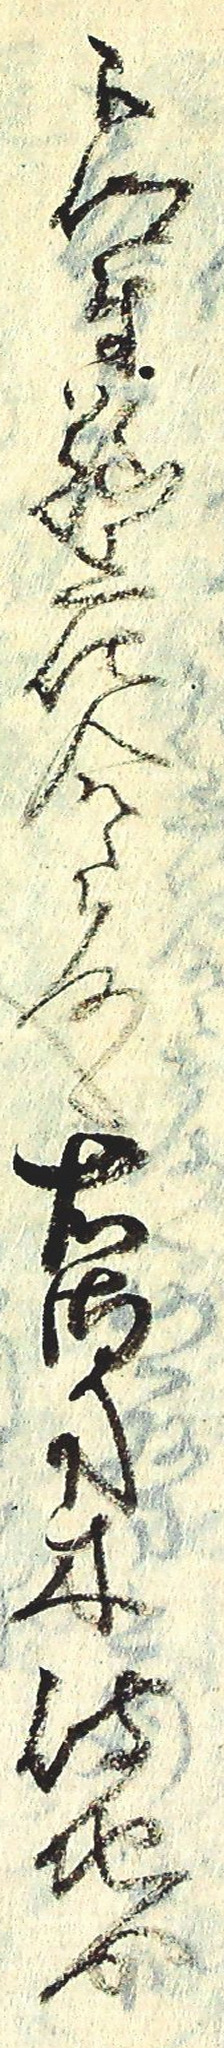被仰付難有仕合に奉存候右御用木彼地ゟ
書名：諸御願書控(弐番）
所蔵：鳴門教育大学 Naruto University of Education
